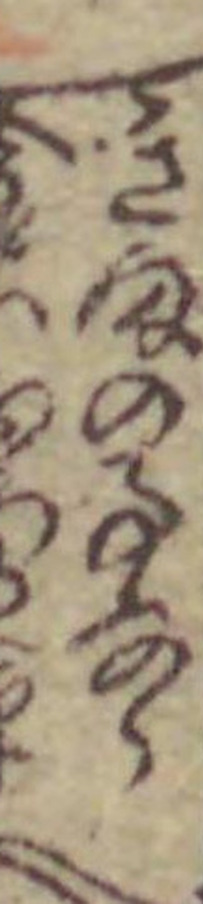きさまの事なら
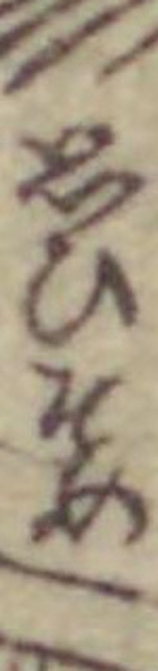思ひそめ
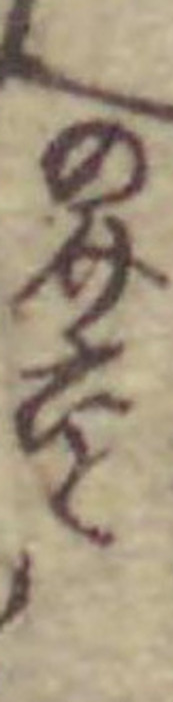の介六と
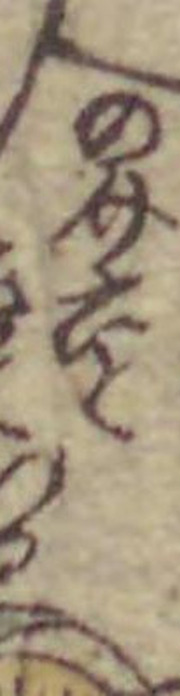の介六と
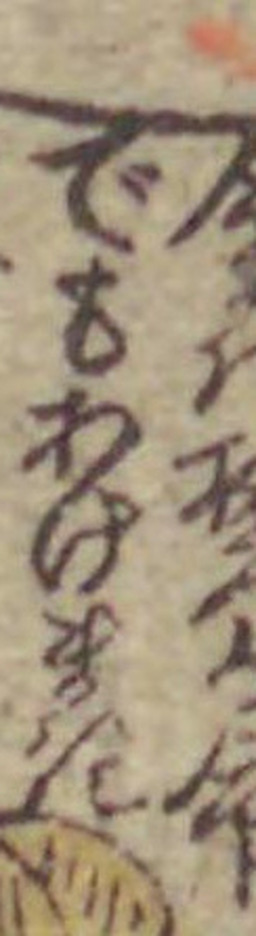でもあけまき
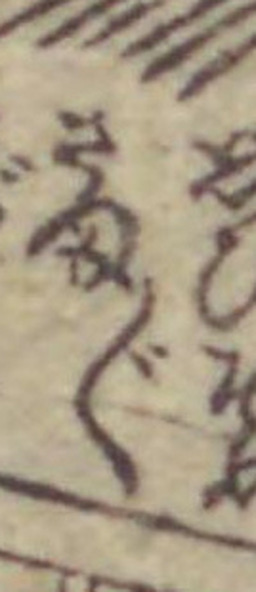さま〴〵
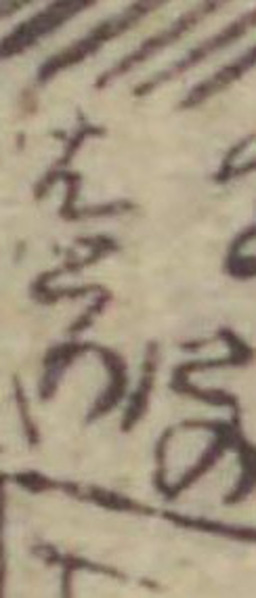はとり
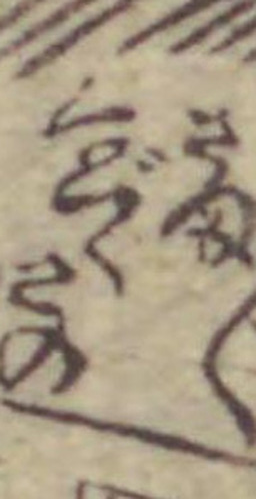くどくさの
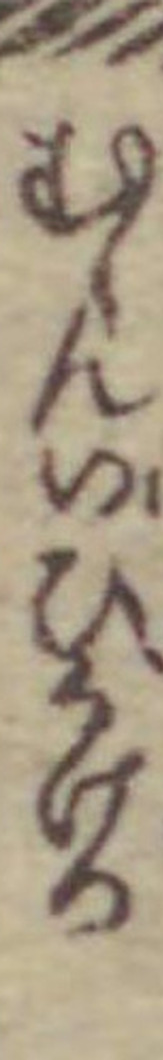むしんいひかける
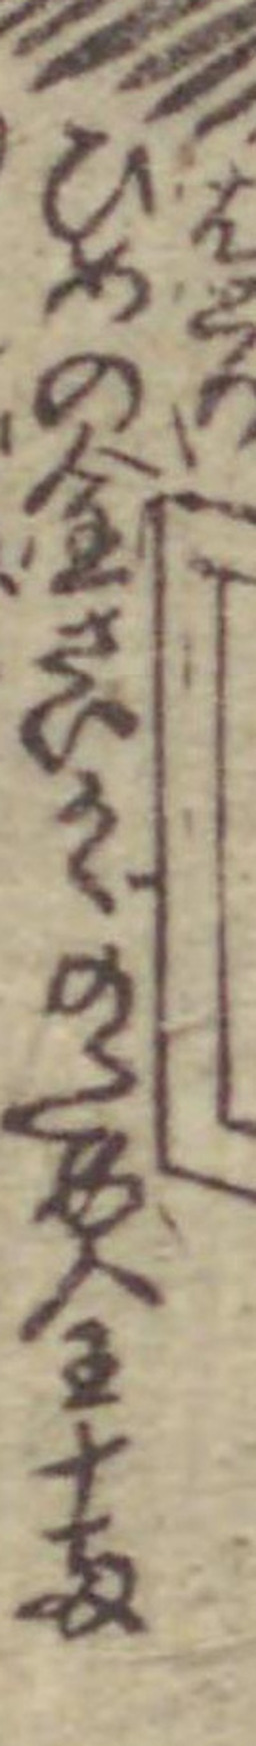ひめの金さいかくのため金十両
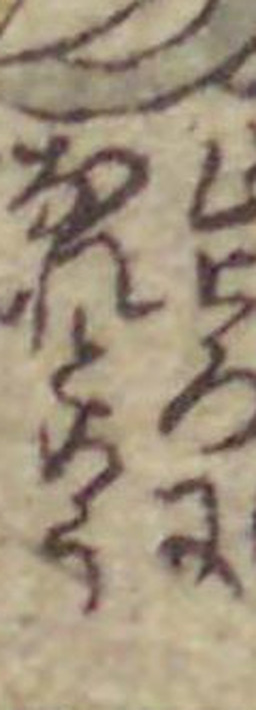おれとめう
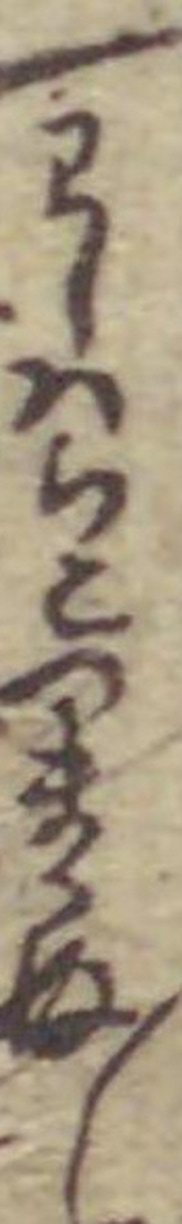わしはちとつまらぬ
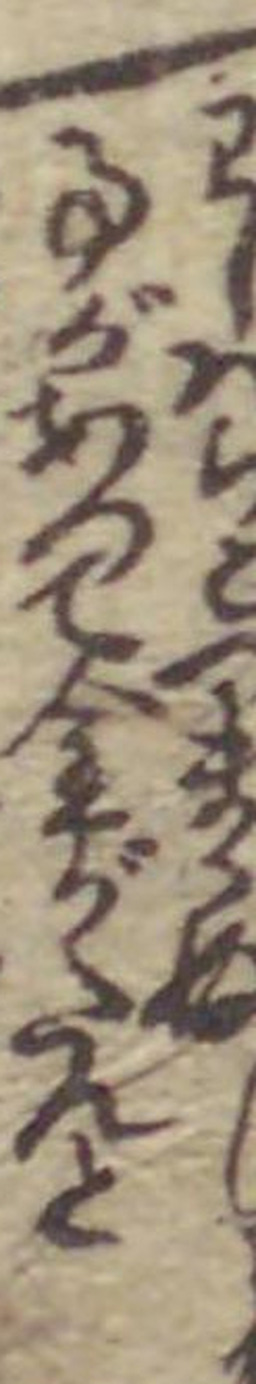事があつて金がたんと
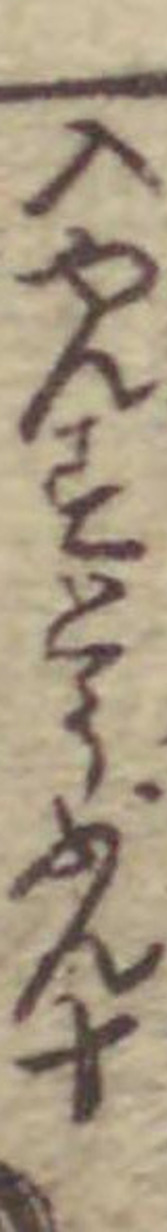入やんすとうぶん十
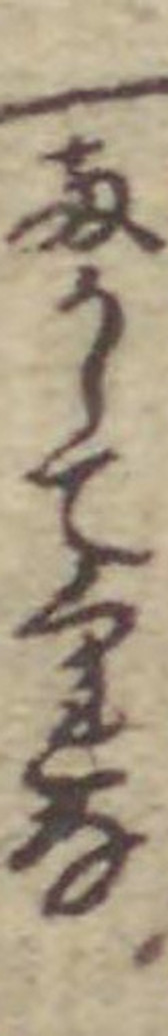両かしてくれな

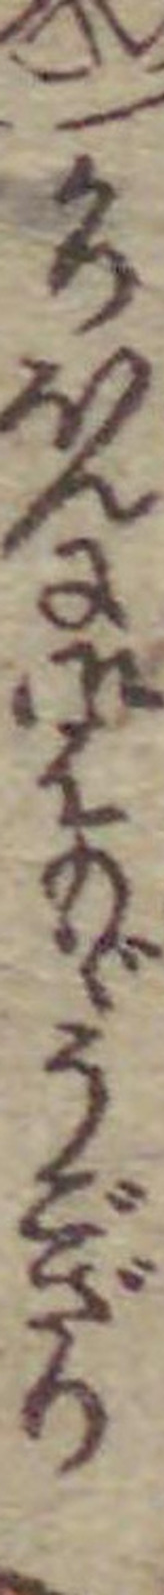かりほんに御はもじうござり
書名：娜二代鉢木 5巻
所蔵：国立国会図書館 National Diet Library, JAPAN
